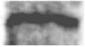一
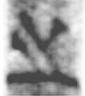之
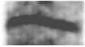一
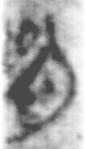○（絶）
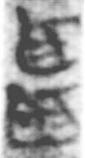聶（攝）
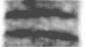二
